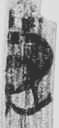莫
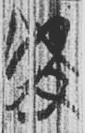奴（如）
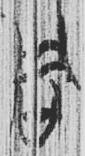同
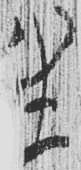生
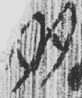多多
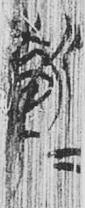薪薪
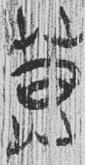莫
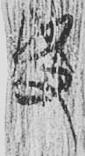奴（如）
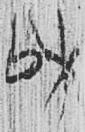松
